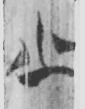少
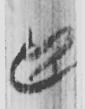臣
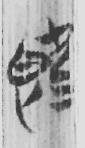既
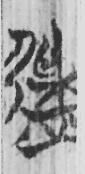{弓采皿}
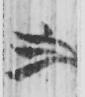之
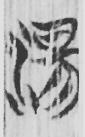湯
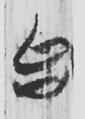句
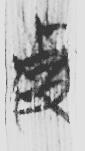妻
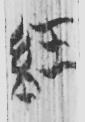紝
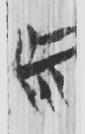巟
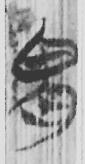胃
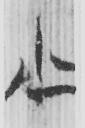少
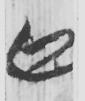臣
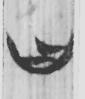曰
